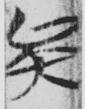矣
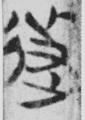﨤（及）
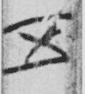五（伍）
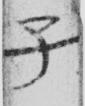子
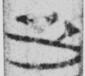疋（胥）
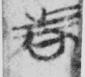者
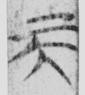天
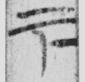下
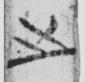之
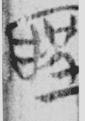聖
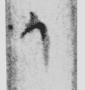人
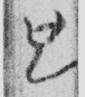也
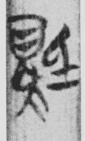鴟
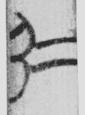𡰥（夷）
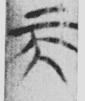而
